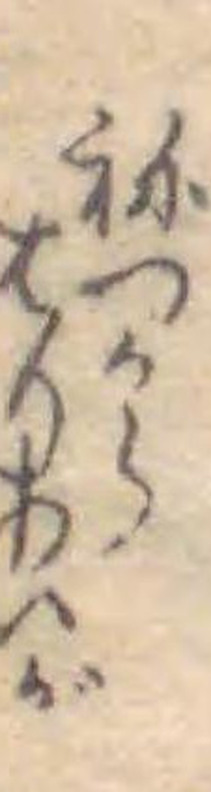はりあいが
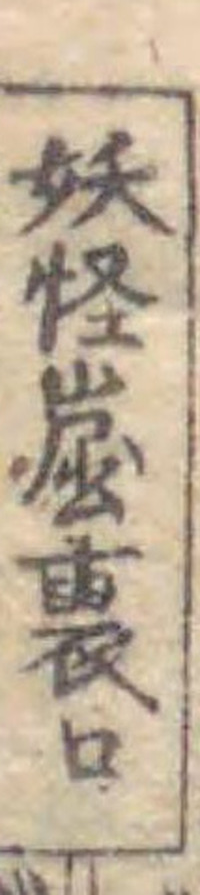妖怪崫裏口
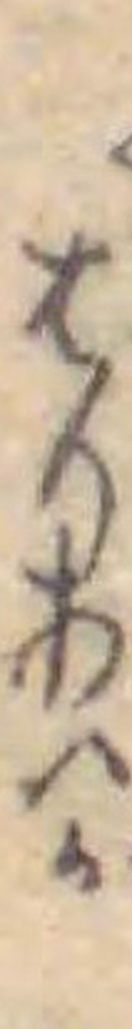はりあいが
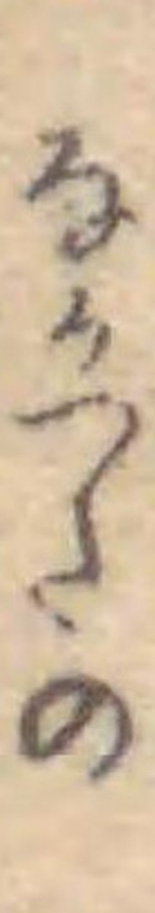なかつたの

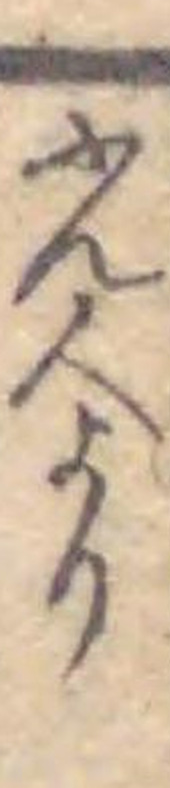ふん人より
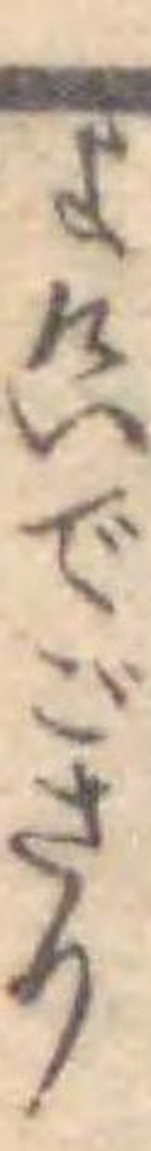よけいでござり
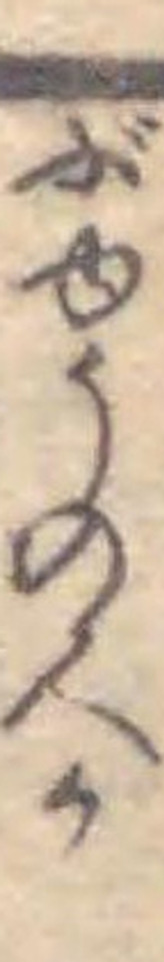ぶゆうの人か
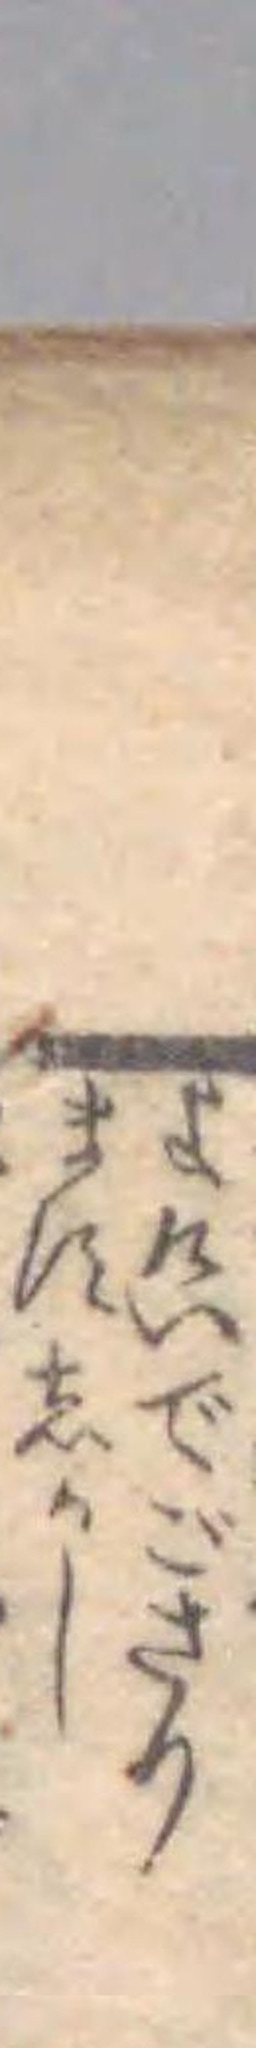ますしかし
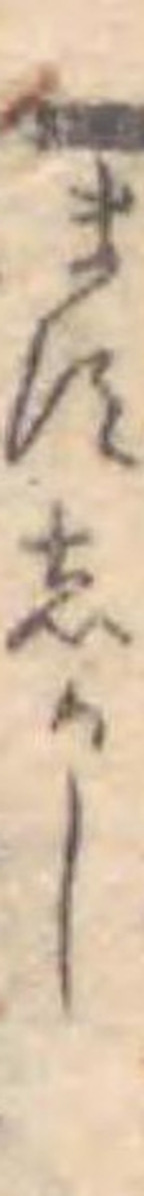ますしかし
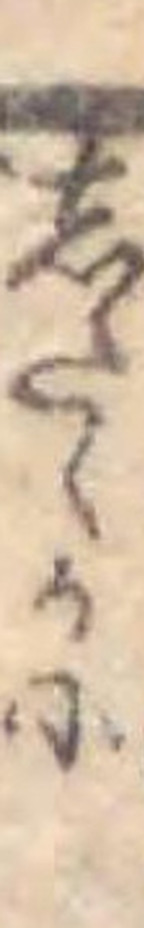したゝかに
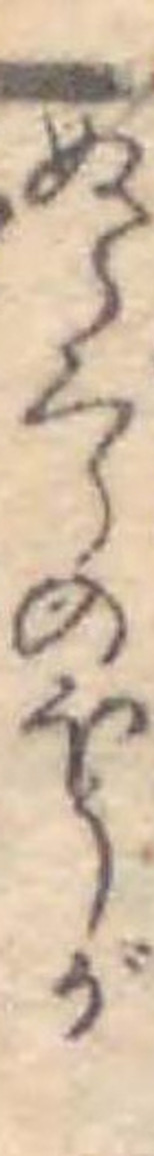ぬらくらのほうが
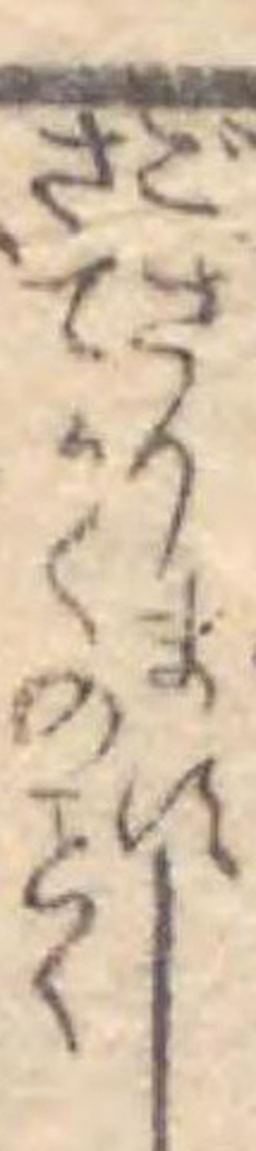さてかくのことく
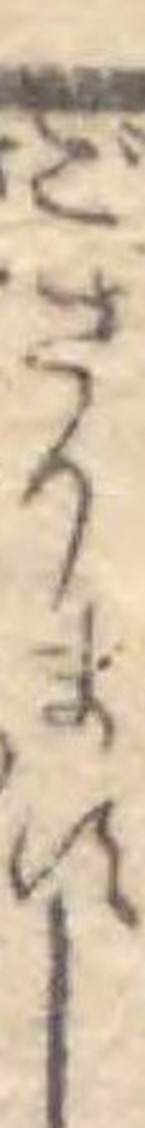ござります
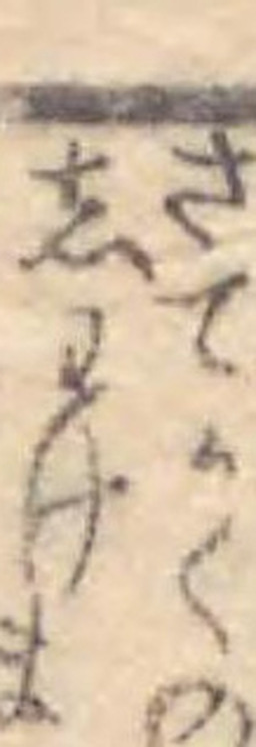みわけ
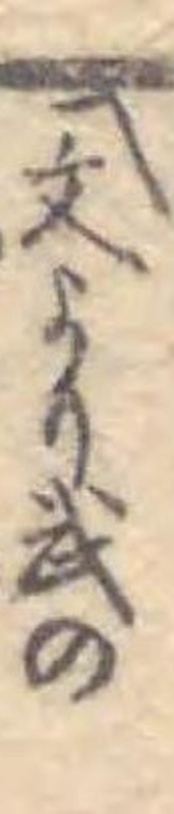〽文より武の
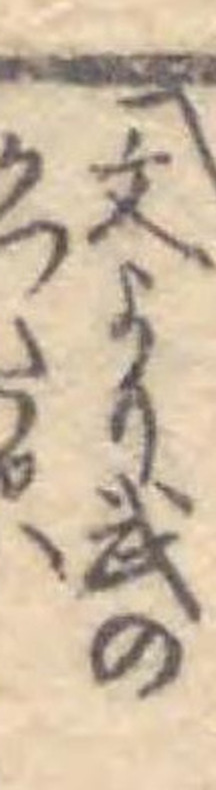〽文より武の
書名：文武二道万石通 : 3巻
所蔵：国立国会図書館 National Diet Library, JAPAN
